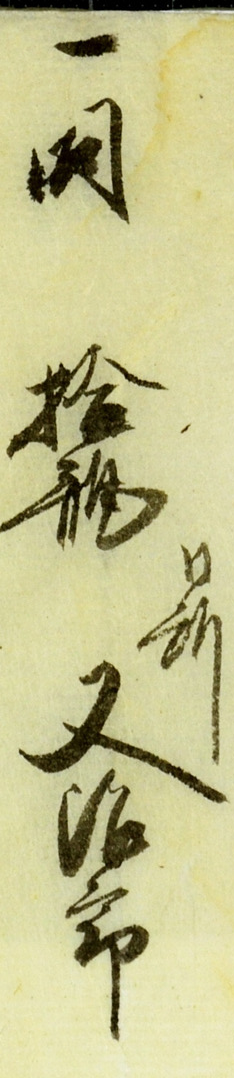一同拾瓶又治郎
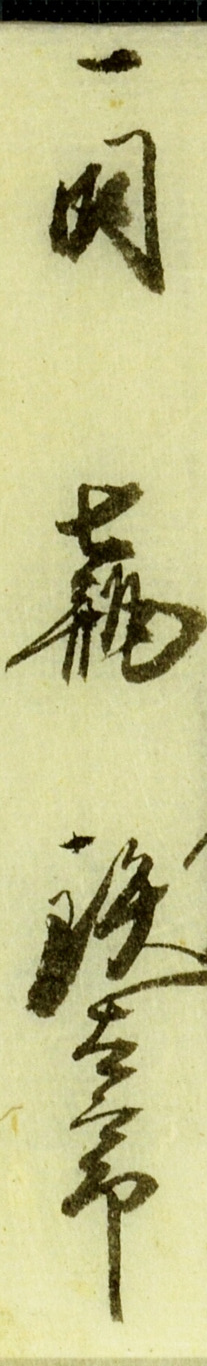一同七瓶鉄太郎
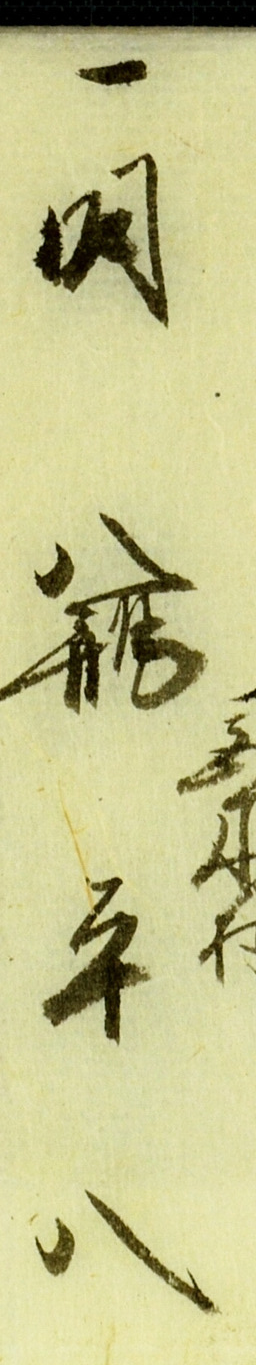一同八瓶平八
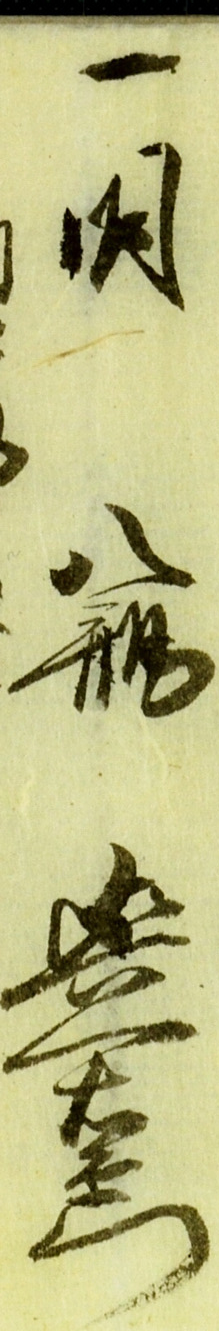一同八瓶与一右衛門
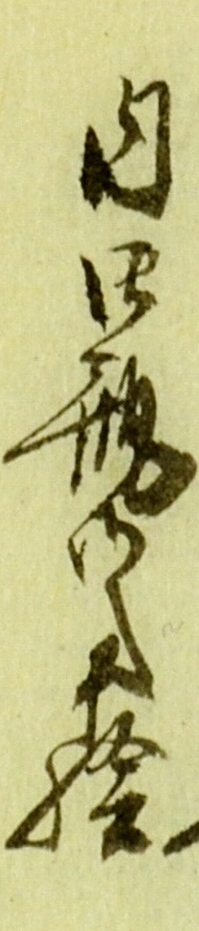内四瓶御用捨
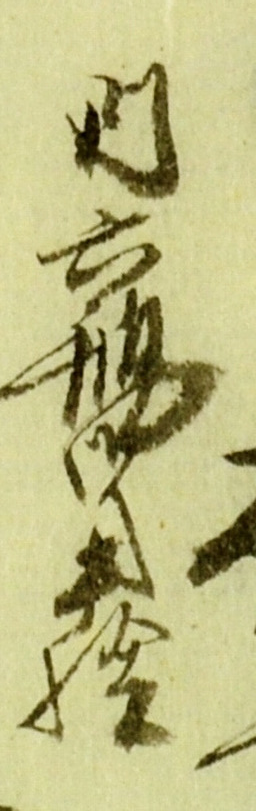内六瓶御用捨
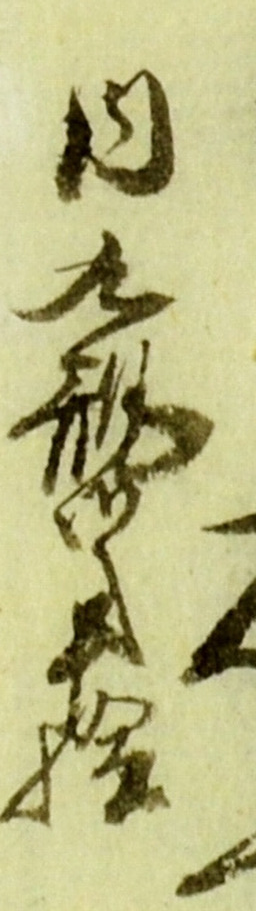内九瓶御用捨
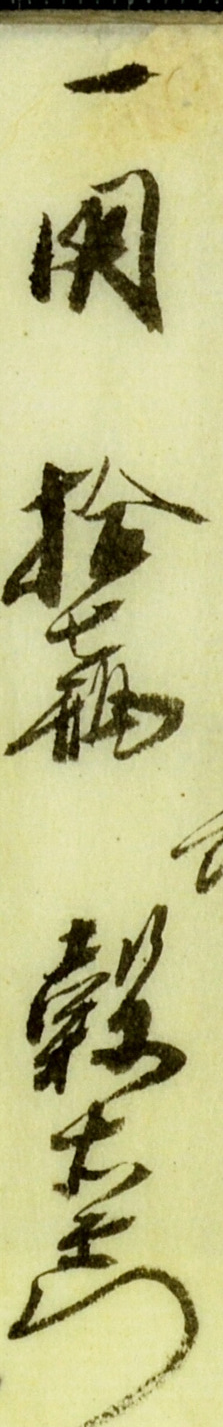一同拾七瓶穀右衛門

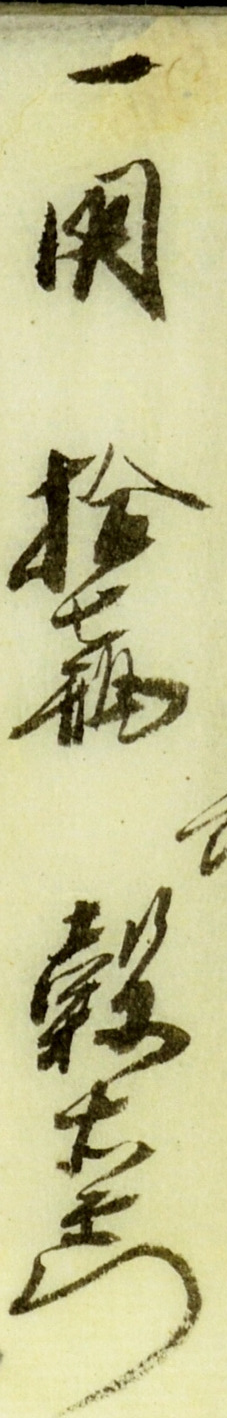一同弐拾四瓶孫右衛門
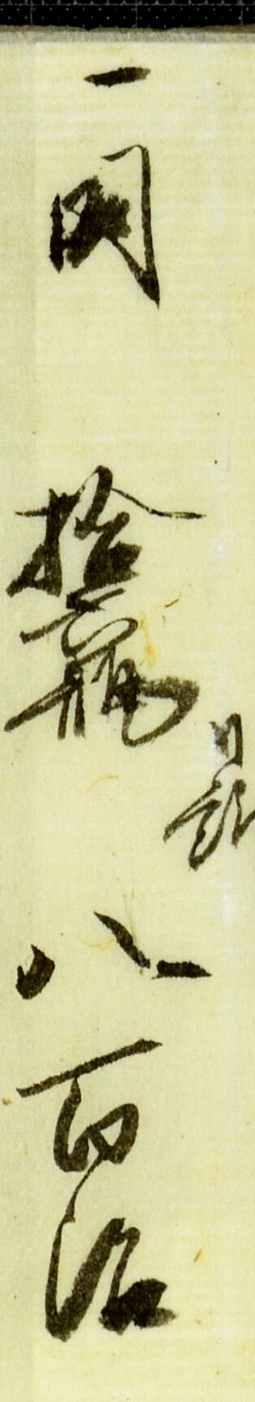一同拾六瓶八百治
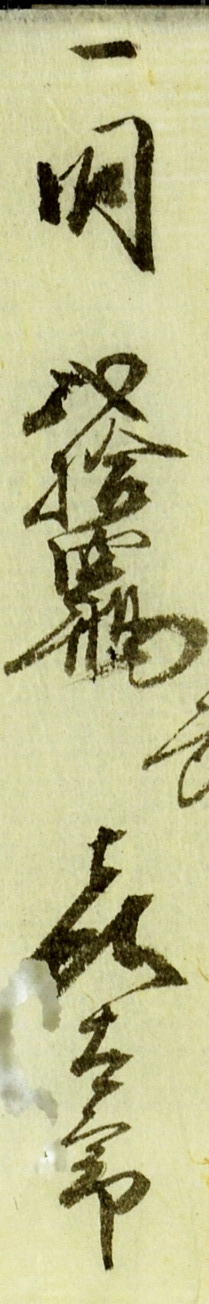一同弐拾四瓶喜太郎
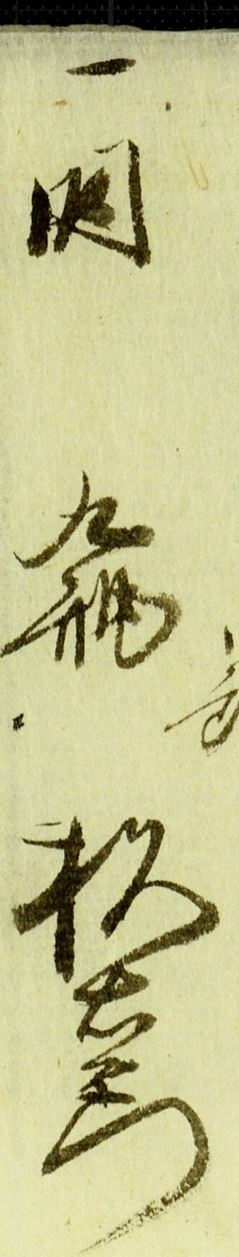一同九瓶杉右衛門
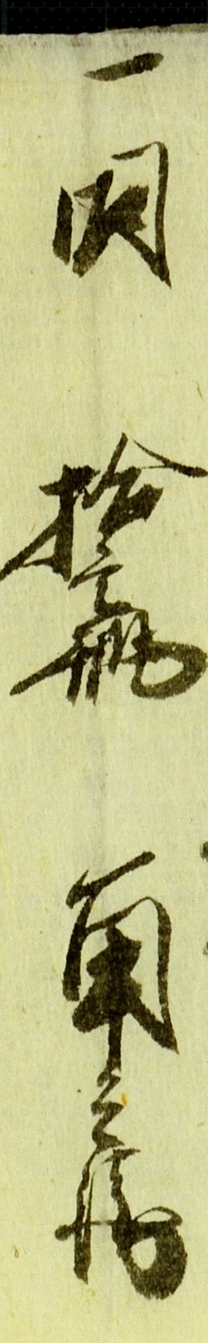一同拾壱瓶角兵衛
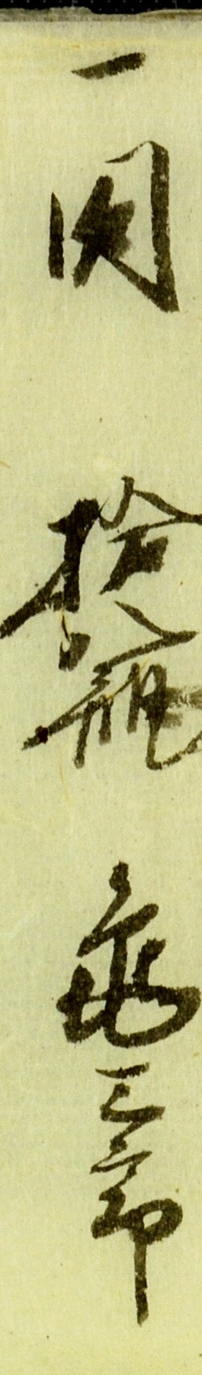一同拾八瓶亀三郎
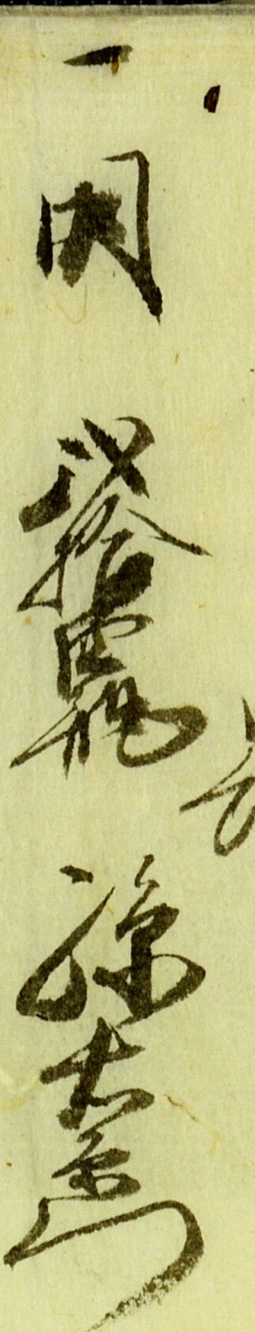一同弐拾四瓶孫右衛門
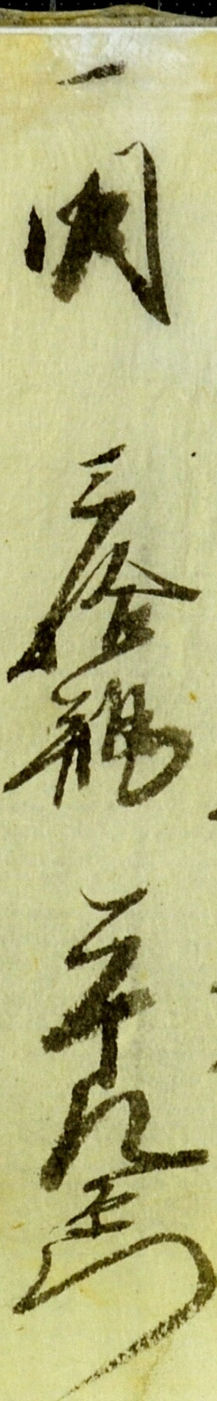一同三拾瓶平左衛門
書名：御領分中御領分中紺屋藍瓶員数御改帳
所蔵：伊那市立高遠町図書館・合同会社AMANE
